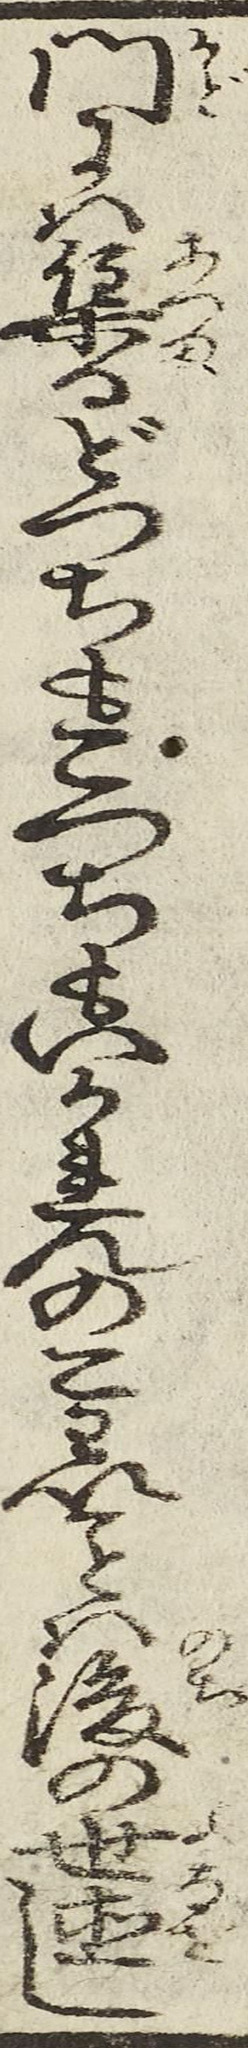門には集るどつちもこつちもいかれんのこわいことは後の世直し

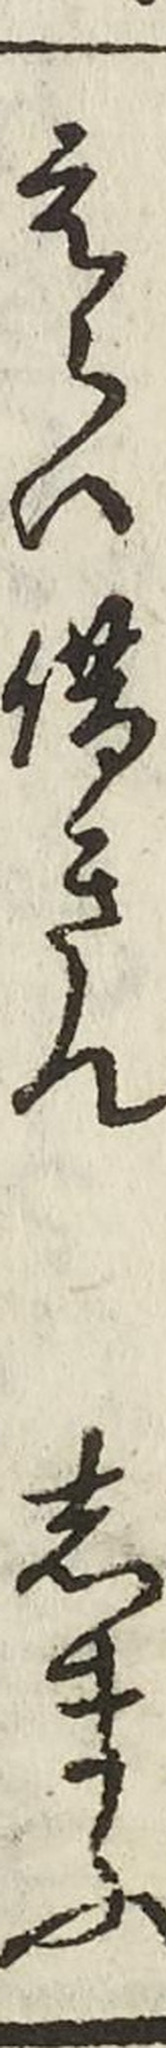えらい借きんしまふ
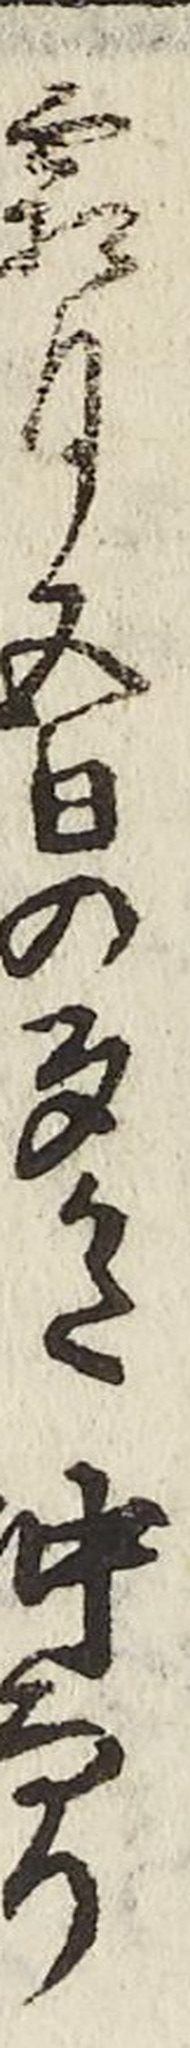霜月五日の夕かた沖なり
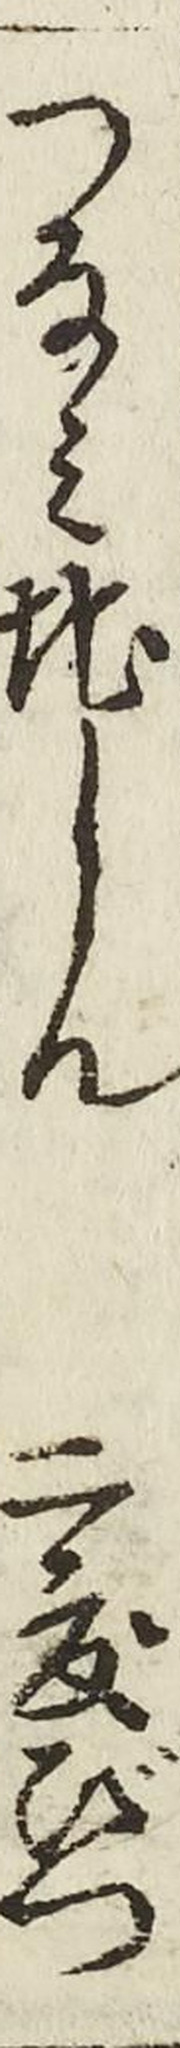つなみ地しん二度びつ
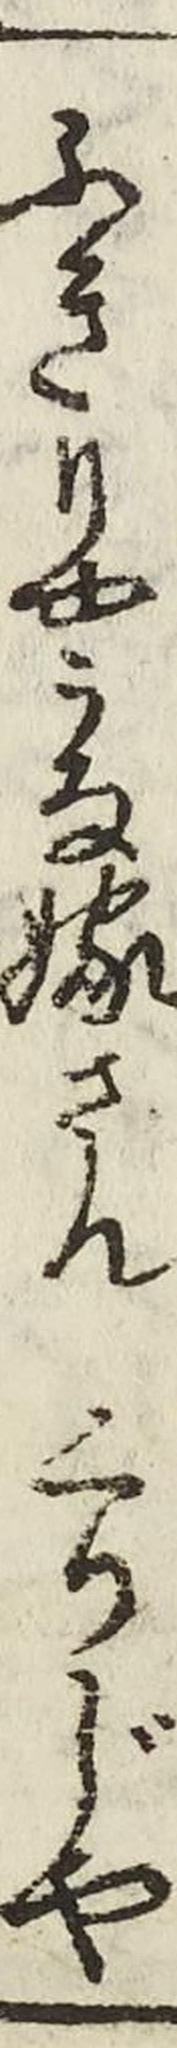ふきりやうな嫁さんくりじや
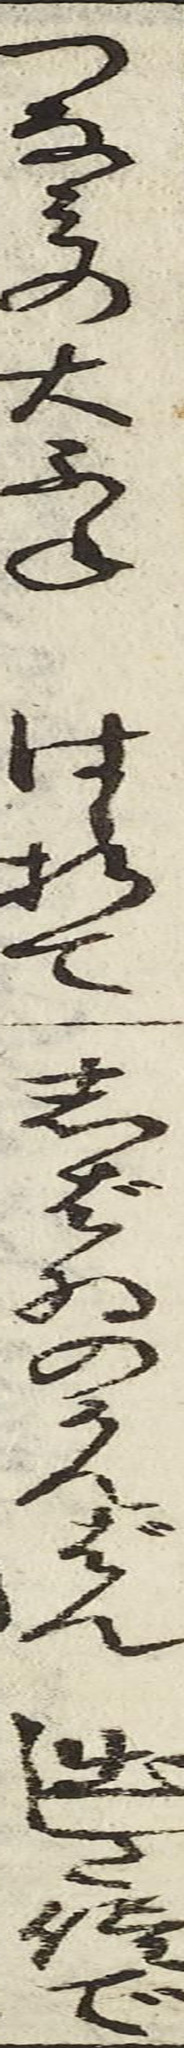つなみの大ふねはし相て
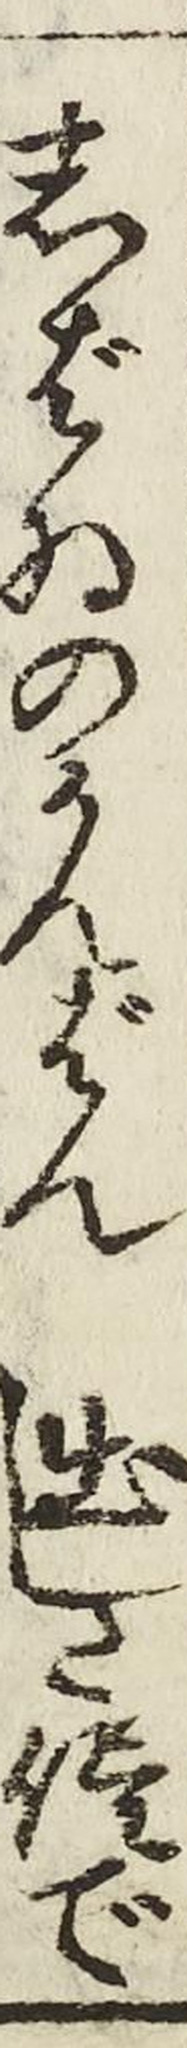しばゐのかんばん出した儘で
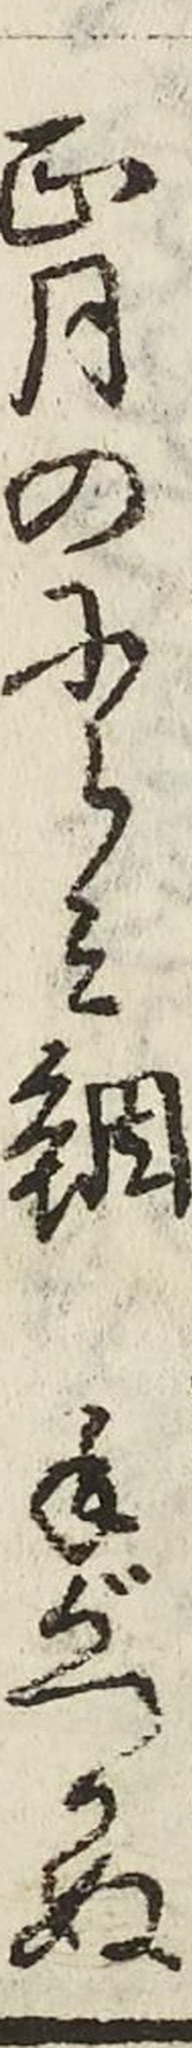正月のにらみ鯛手がつかぬ
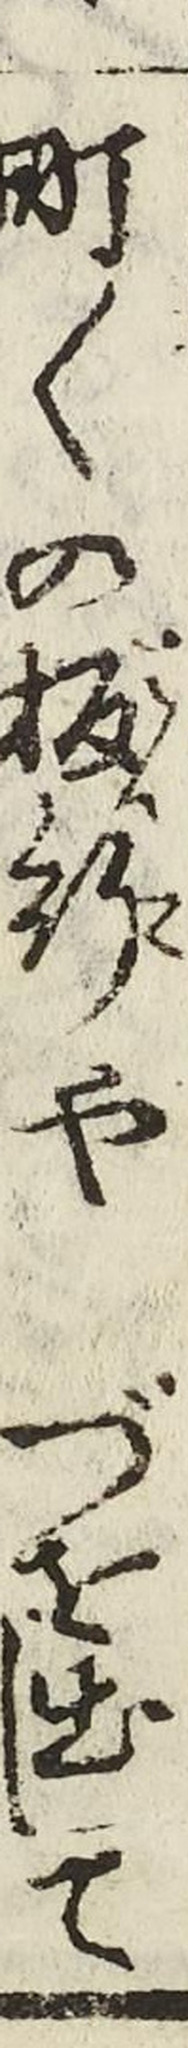町々の板行やづを出して
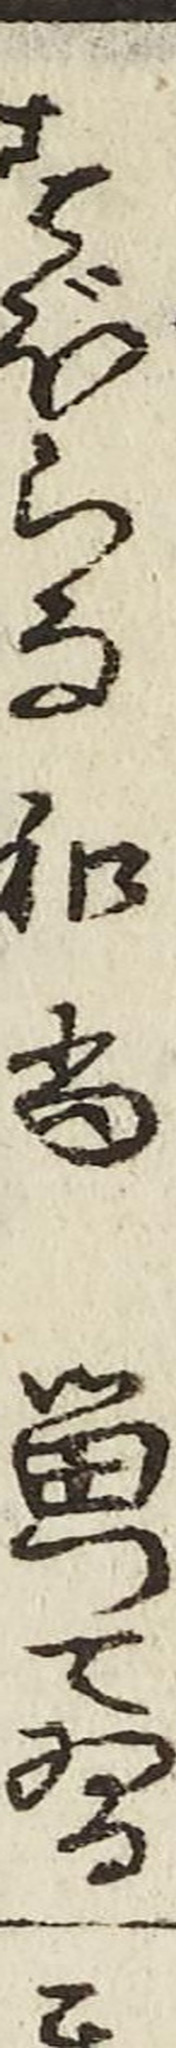すぼらな和尚留つてゐる
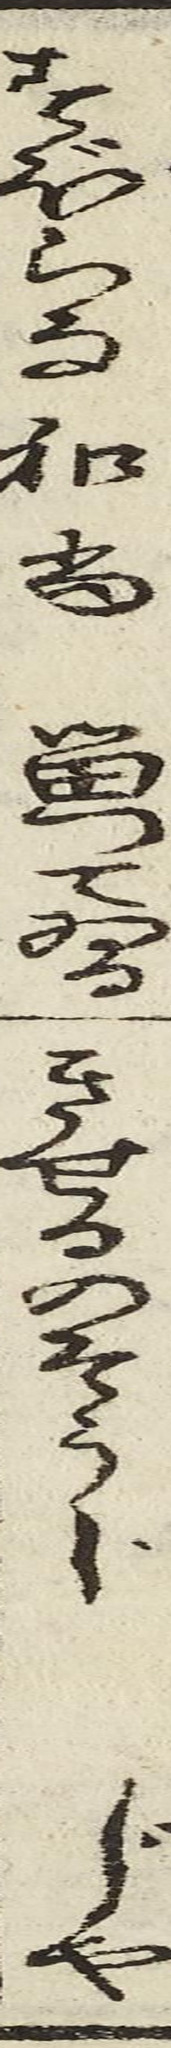すぼらな和尚留つてゐる
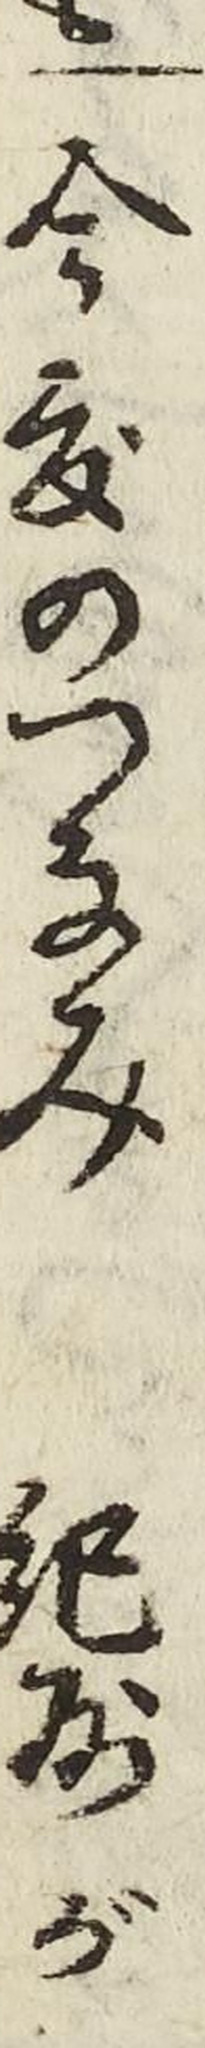今度のつなみ紀州が
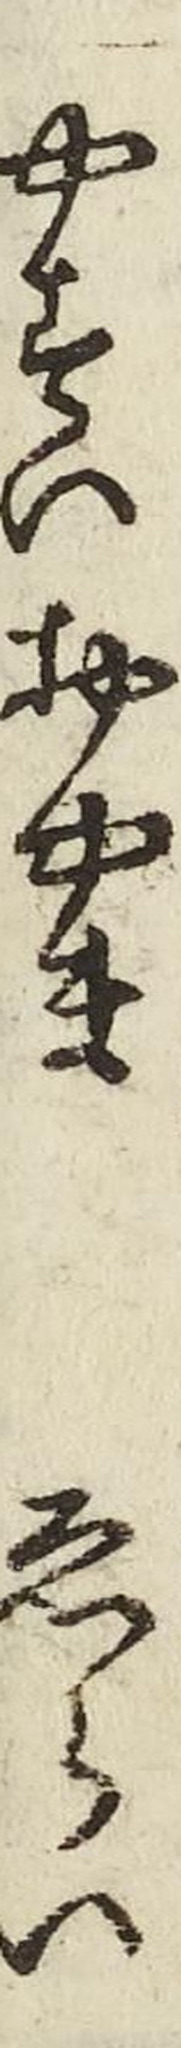やすいおやまゑらい
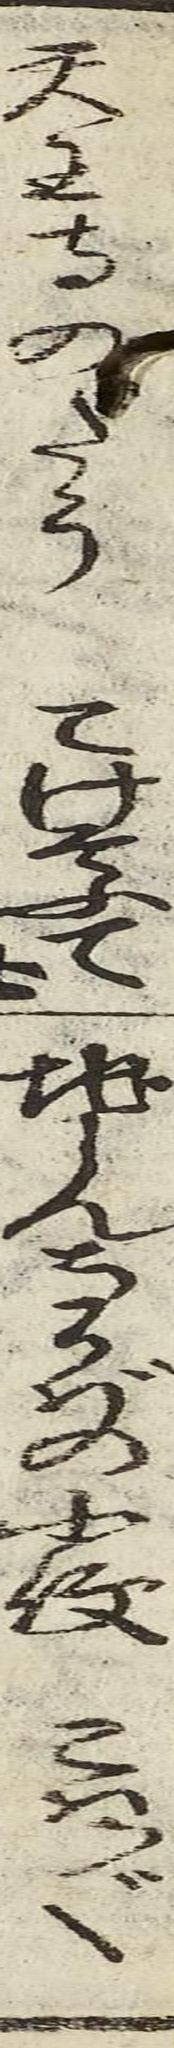地しんなかばの小便こは〳〵
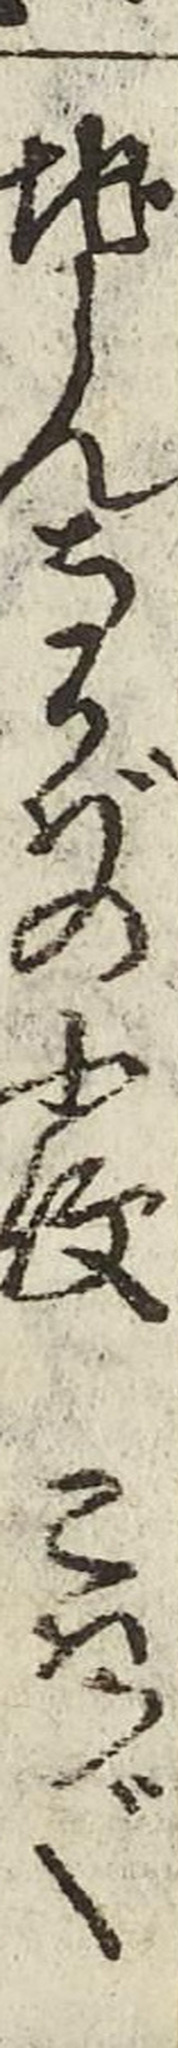地しんなかばの小便こは〳〵
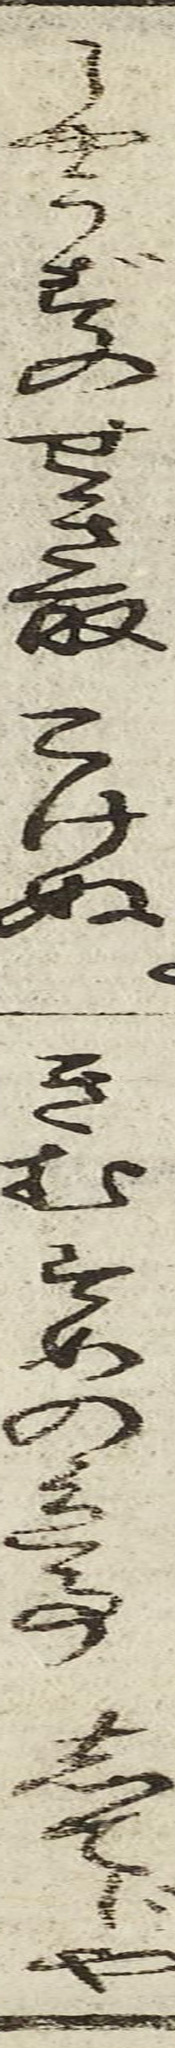しやうずのせき取こけぬ
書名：地震津浪末代噺の種　全
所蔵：東京大学地震研究所図書室 Earthquake Research Institute Library, The University of Tokyo, JAPAN
